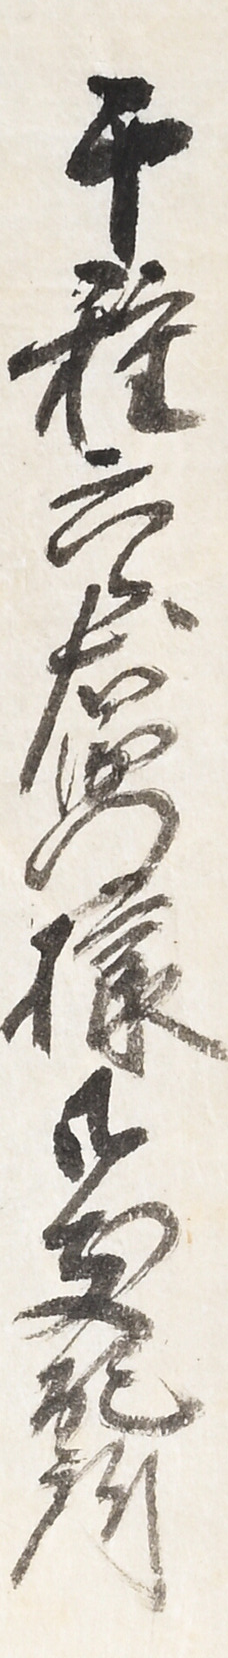平種六郎右衛門様御支配所
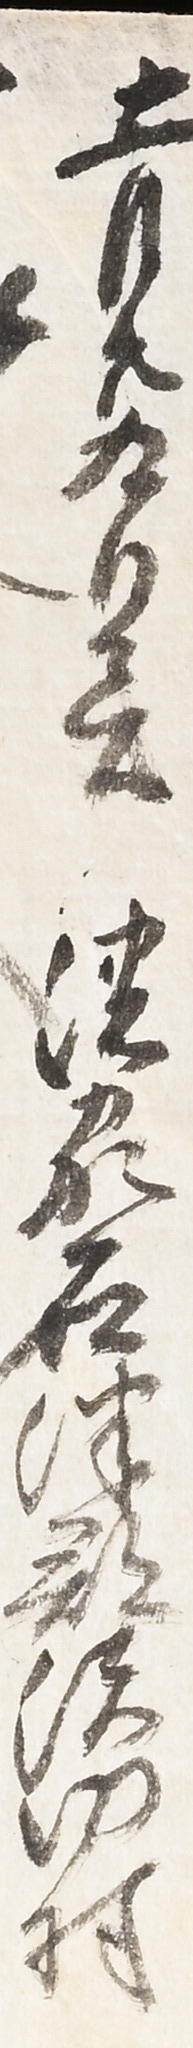十一月廿九日着濃州石津郡沢田村
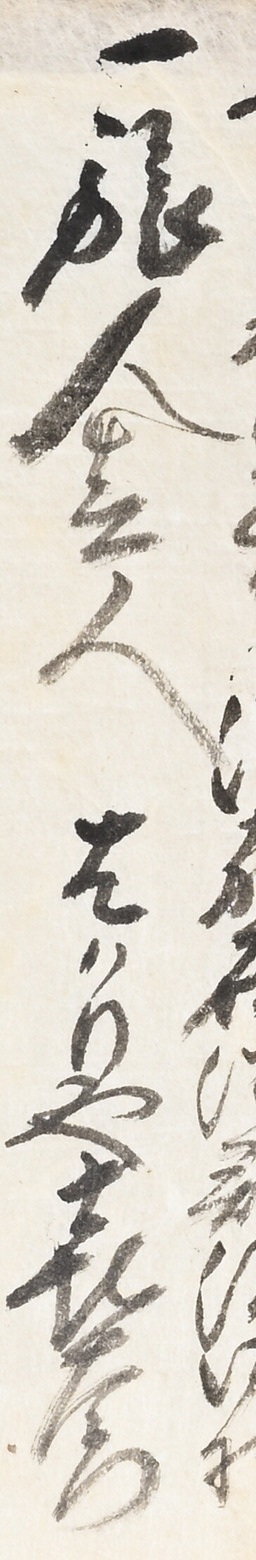一旅人壱人はかりや喜右衛門
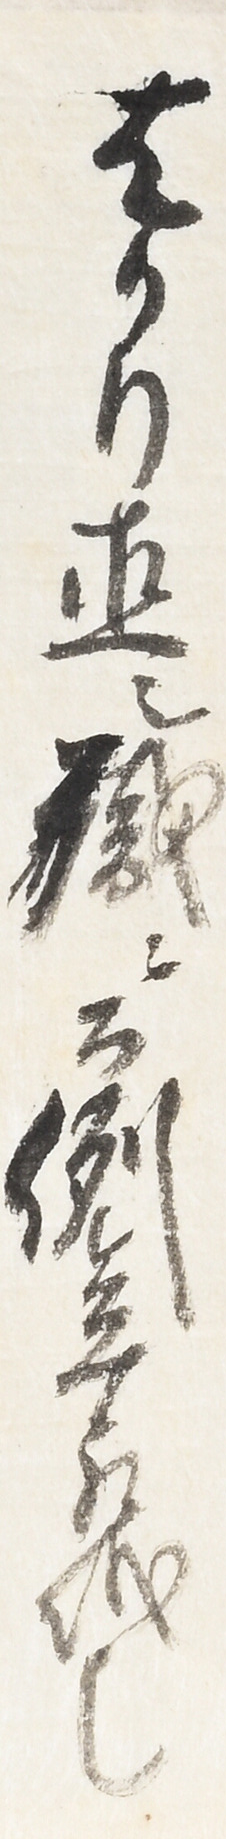はかり直シ職ニ而例年罷越申候
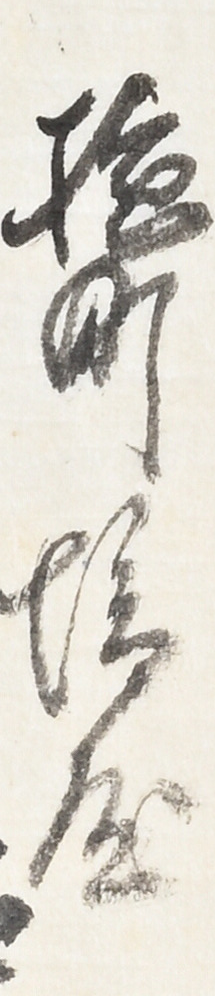横町塩屋
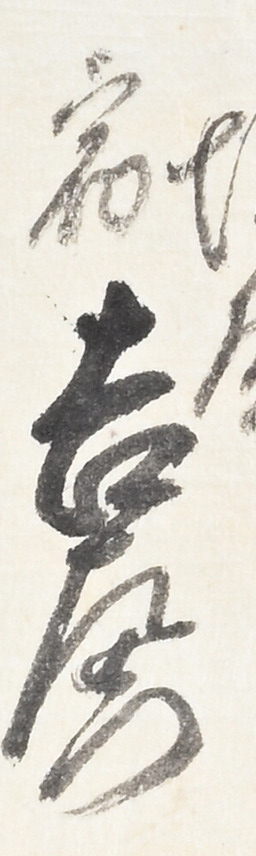宿吉左衛門

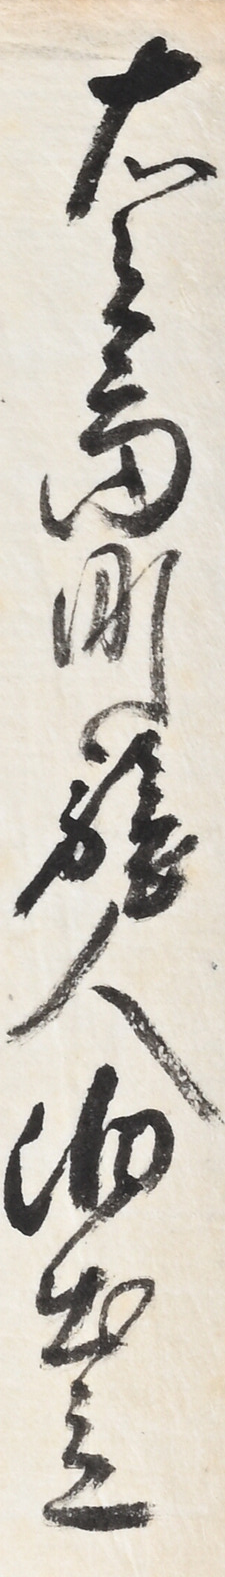右者当町旅人泊出立
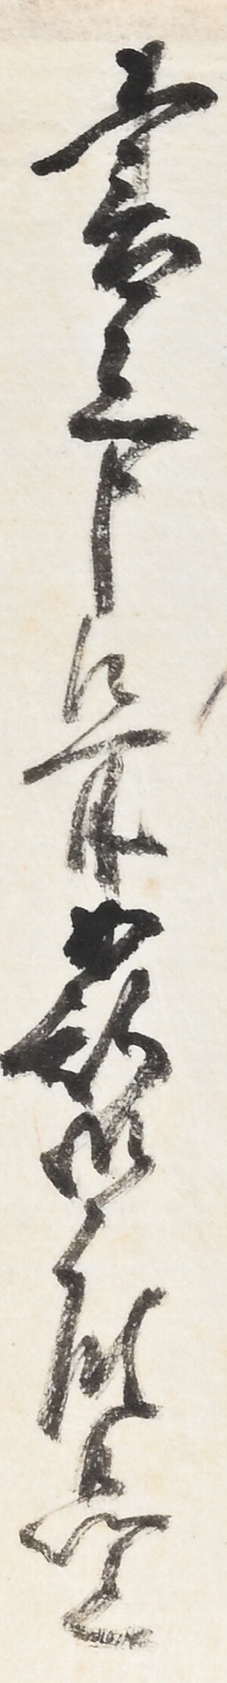書上申候所如斯御座候以上
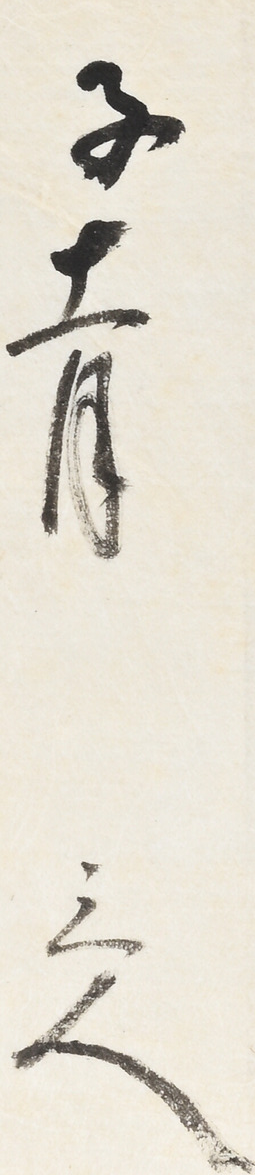子十一月三人
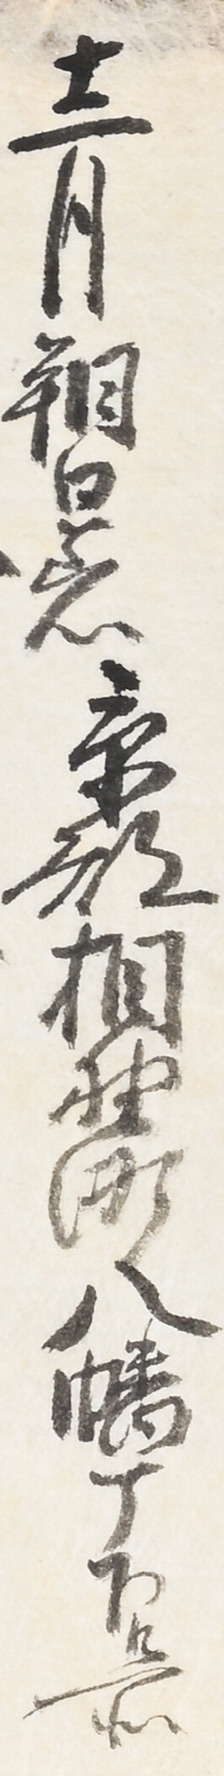十二月朔日着京都相野町八幡丁下ル所
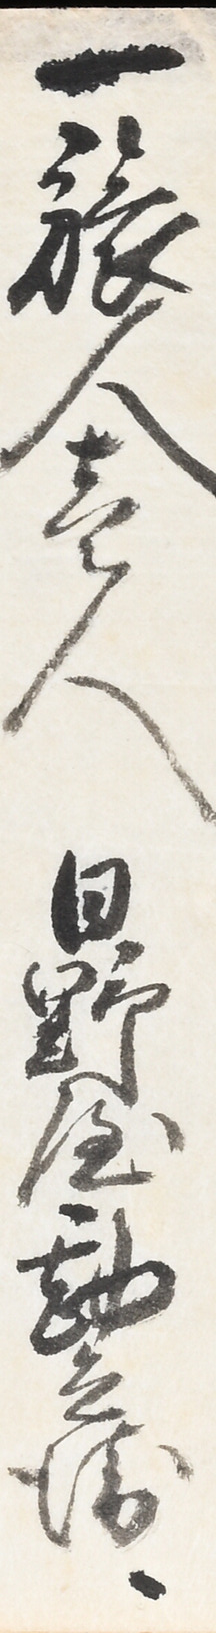一旅人壱人日野屋勘兵衛・
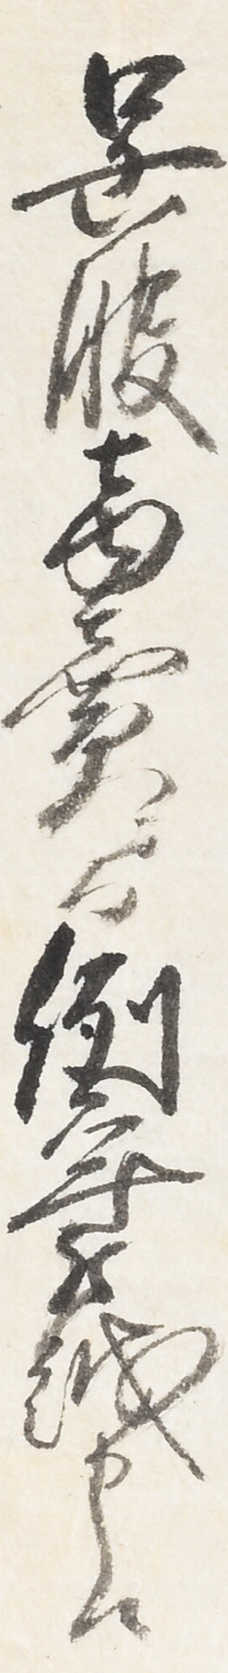呉服商売ニ而例年罷越申候
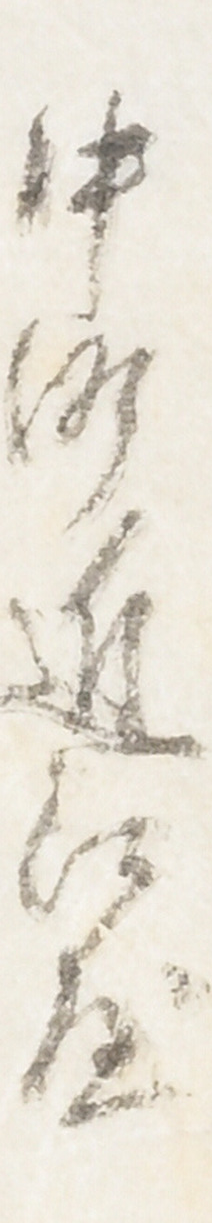中町近江屋
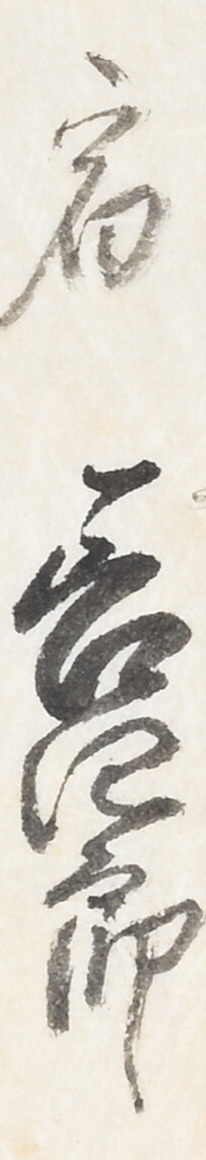宿善四郎
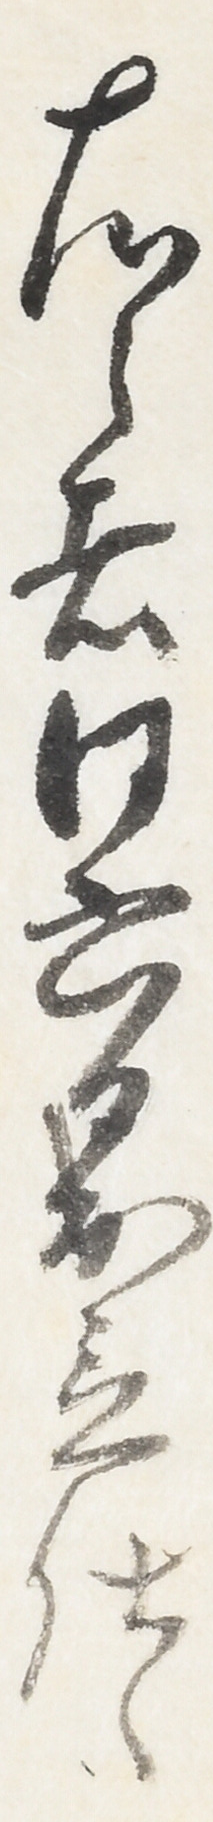右之者同六日出立仕候
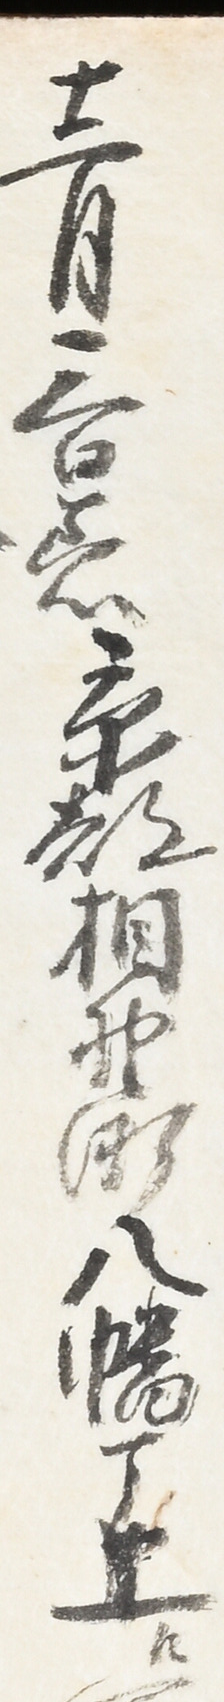十二月三日着京都相野町八幡丁上ル所
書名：旅人泊控帳
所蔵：伊那市立高遠町図書館・合同会社AMANE
